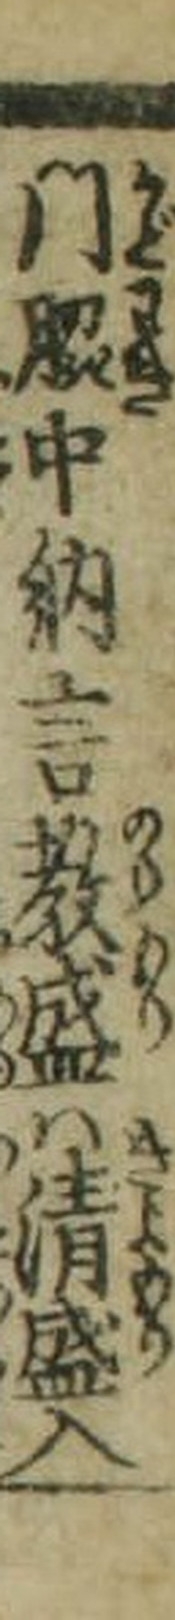門脇中納言教盛は清盛入
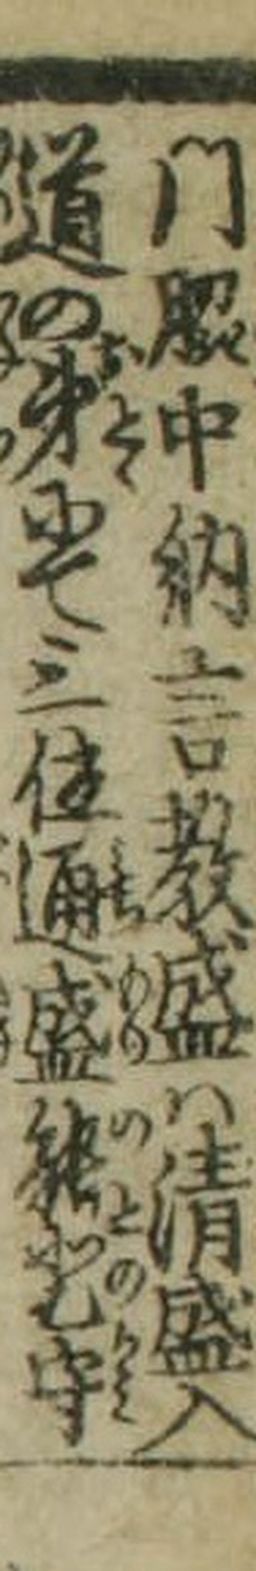道の弟にて三位通盛能登守
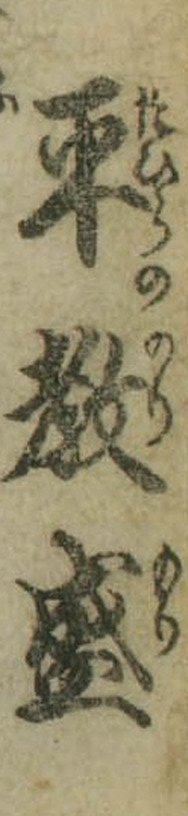平教盛
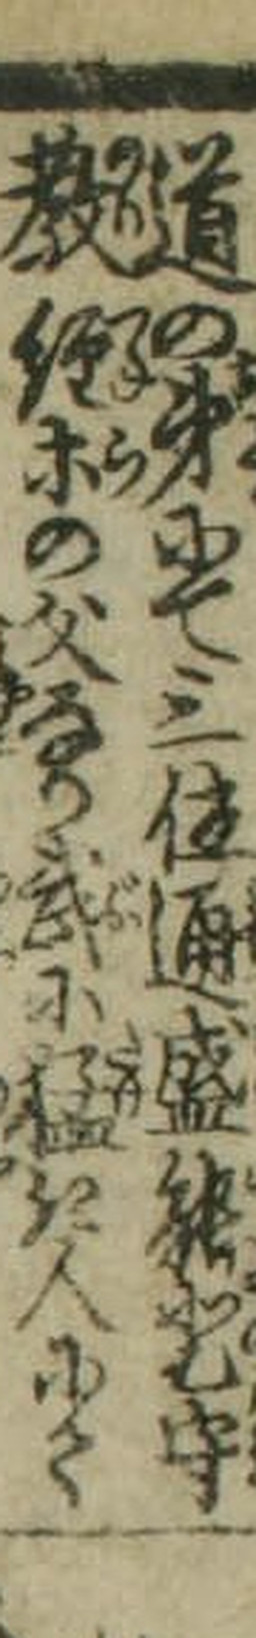教経等の父なり武に猛き人にて
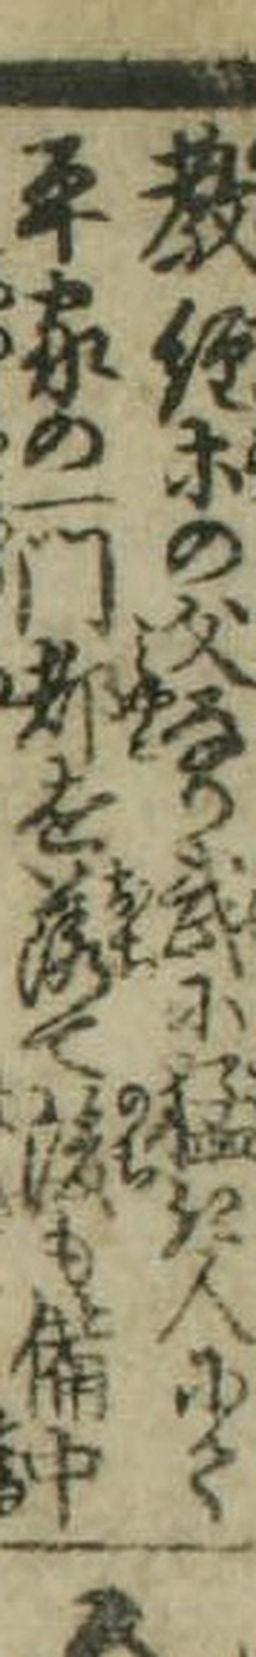平家の一門都を落て後も備中
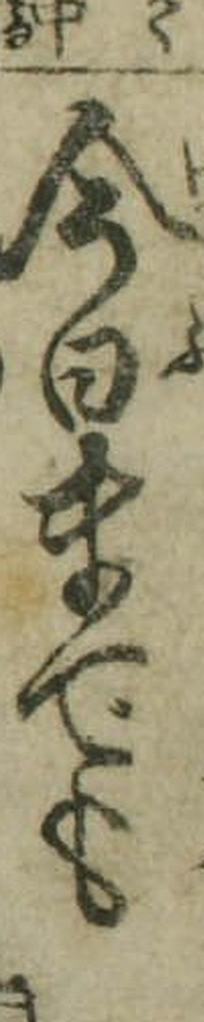今日までも
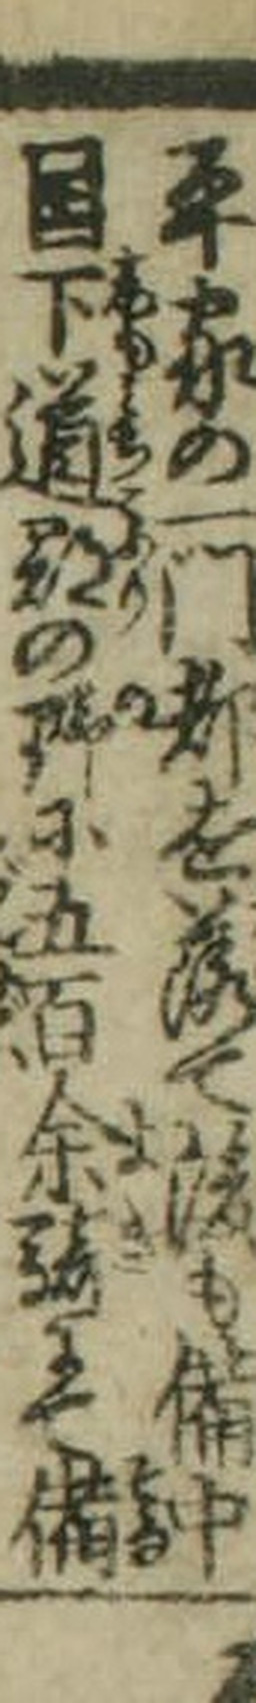国下道郡の野に五百余騎にて備
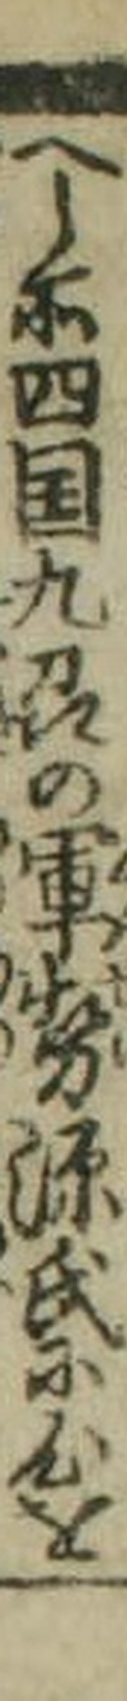へし所四国九州の軍勢源氏に心を
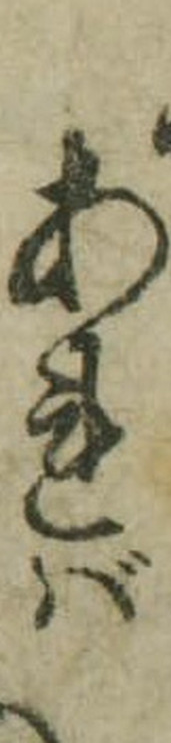あれば
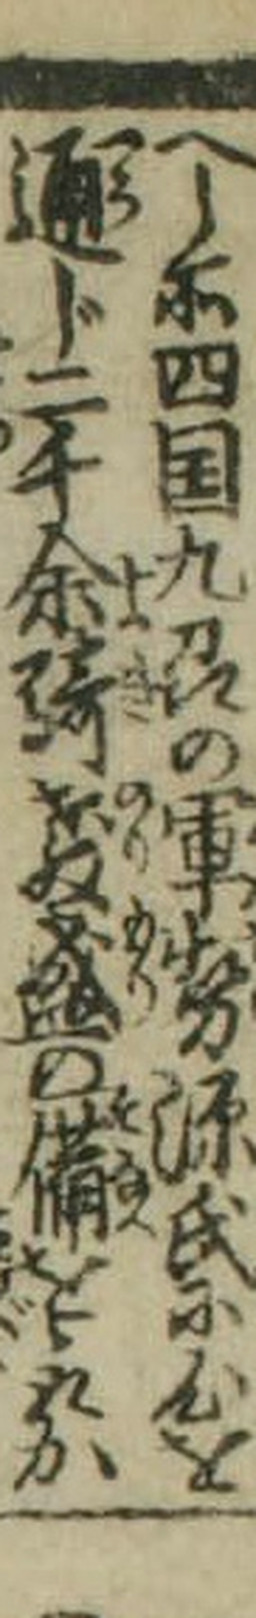通じ二千余騎教盛の備を取か
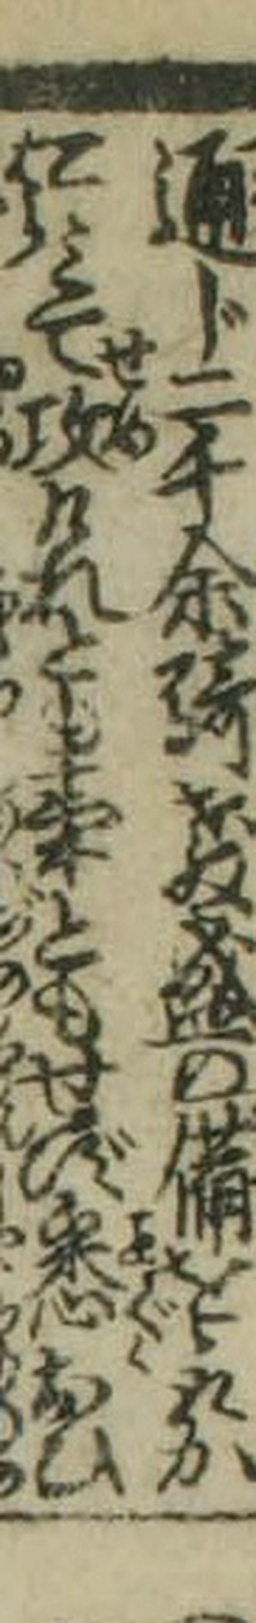こみて攻けれとも事ともせず悉おひ
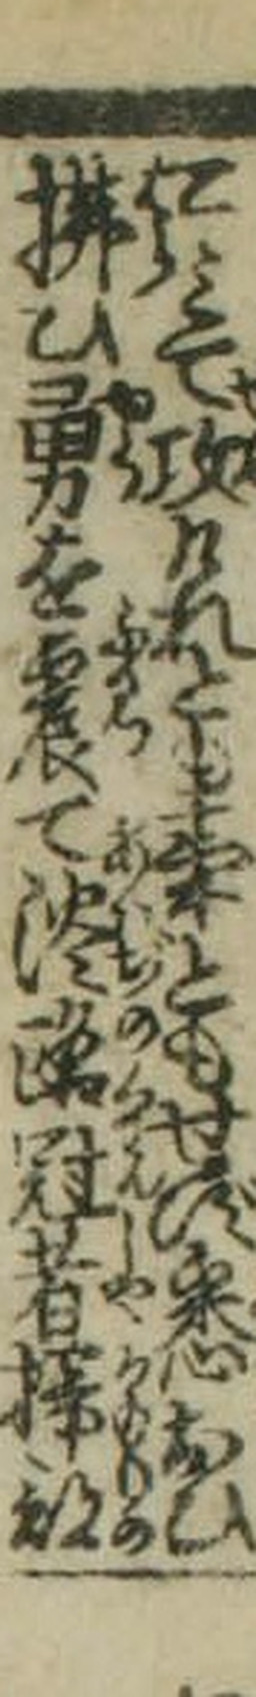拂ひ勇を震て淡路冠者掃部
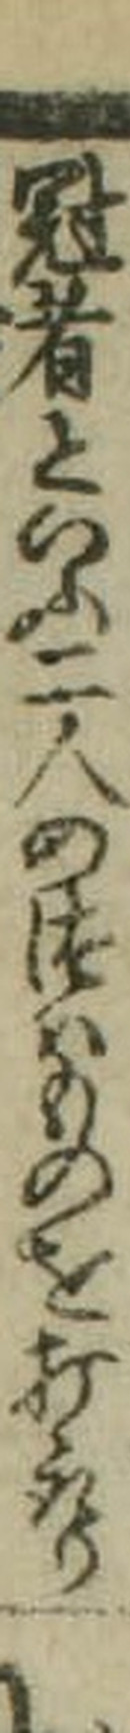冠者といふ二人のつはものを打取り
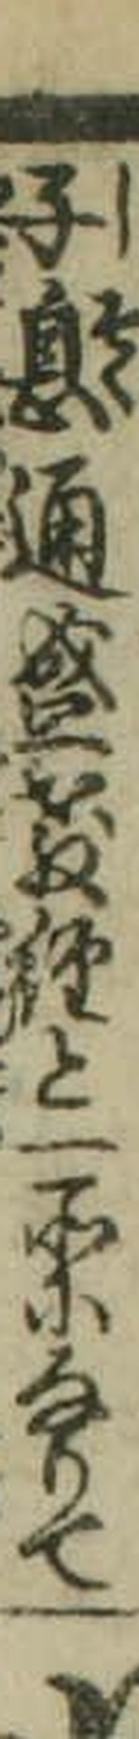子息通盛教経と一所になりて
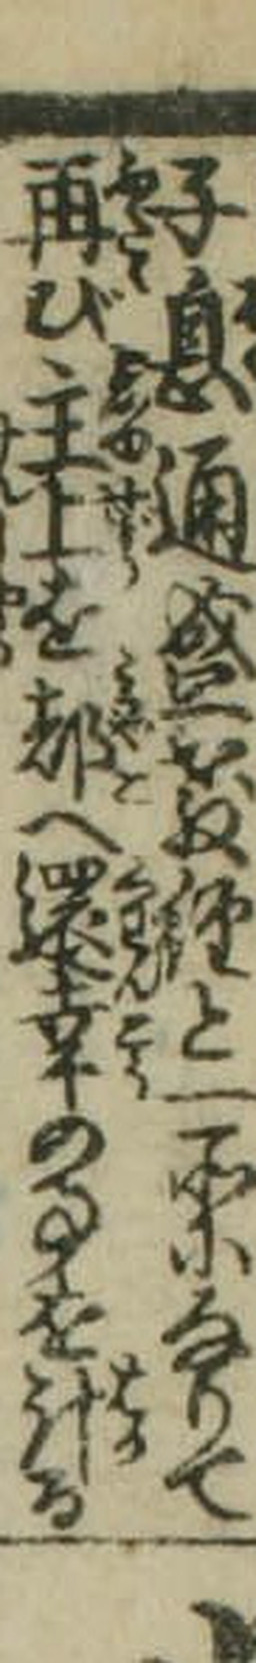再び主上を都へ還幸の事を計る
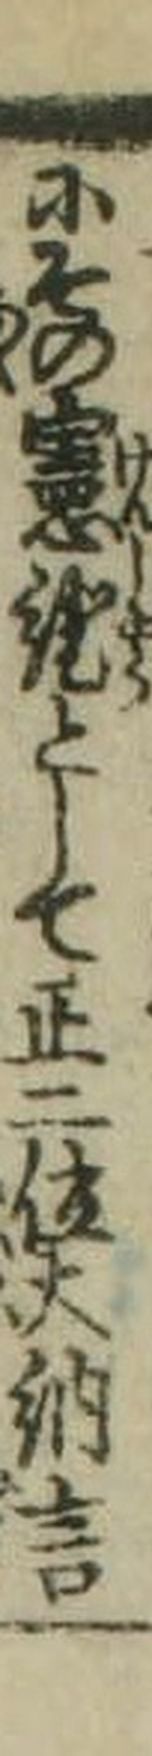にその憲證として正二位大納言
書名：續英雄百人一首
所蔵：東京学芸大学附属図書館
